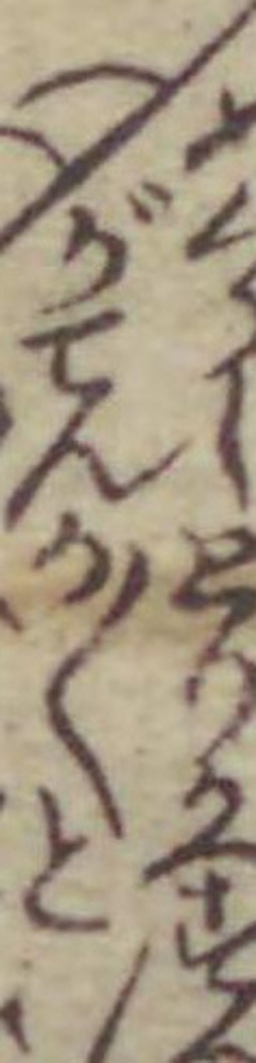がてんか〳〵と
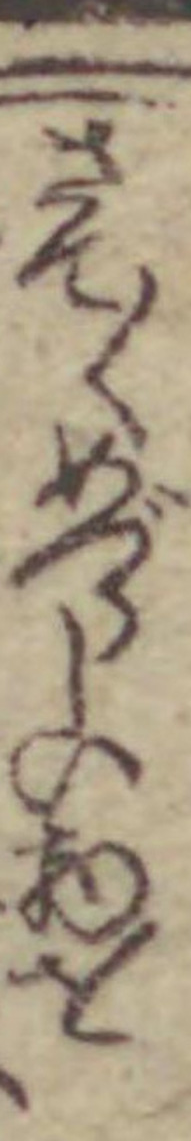さて〳〵めづらしい物を
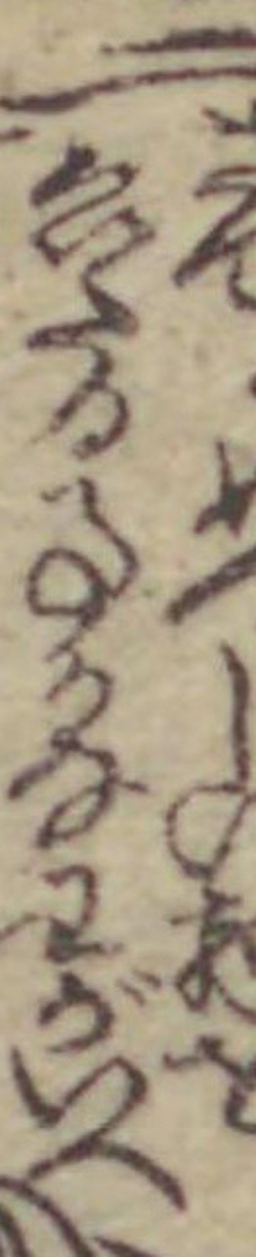かいたる事かなわがいへ
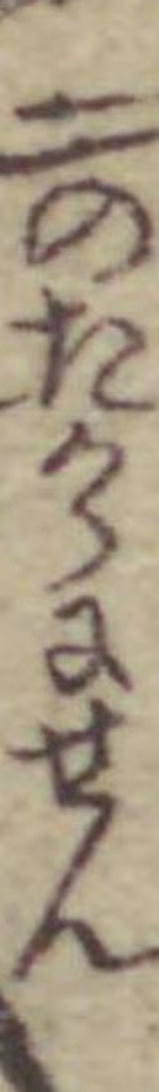のたからにせん
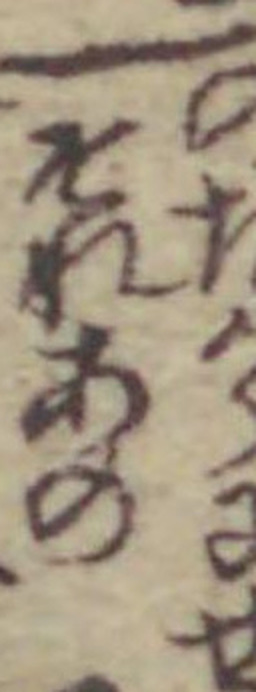それあの
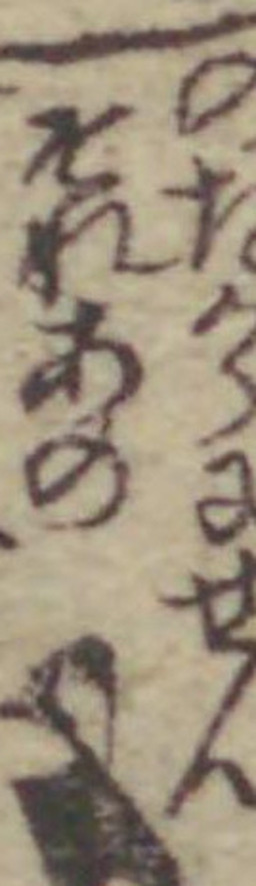それあの
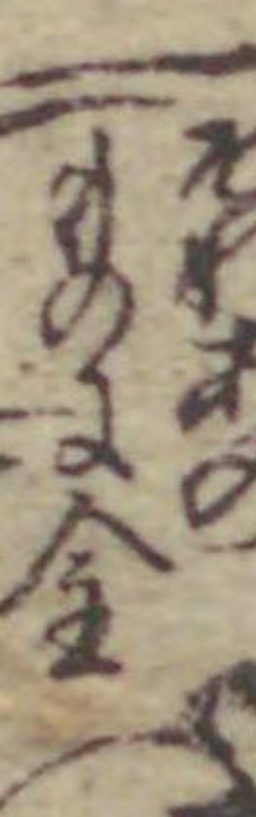ものに金
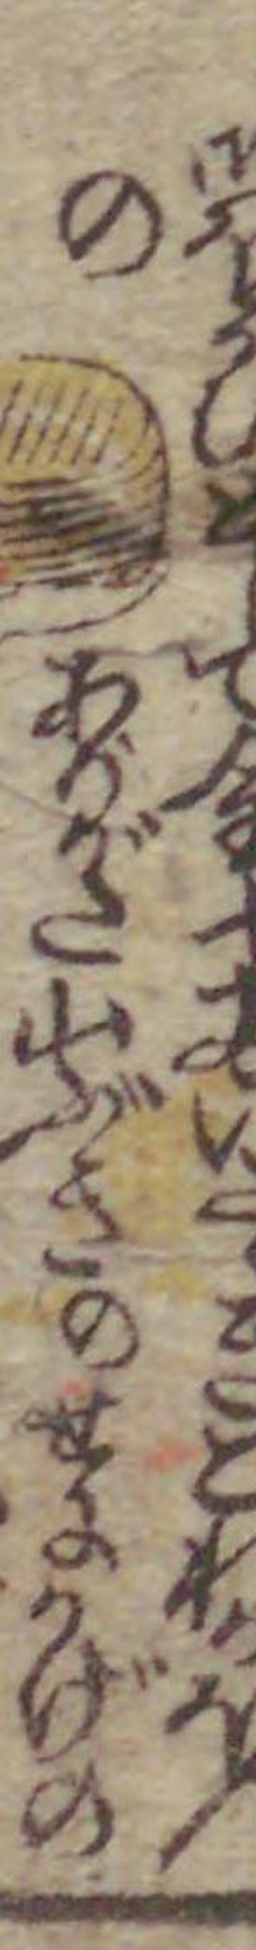のありがた山ぶきのせにかげの
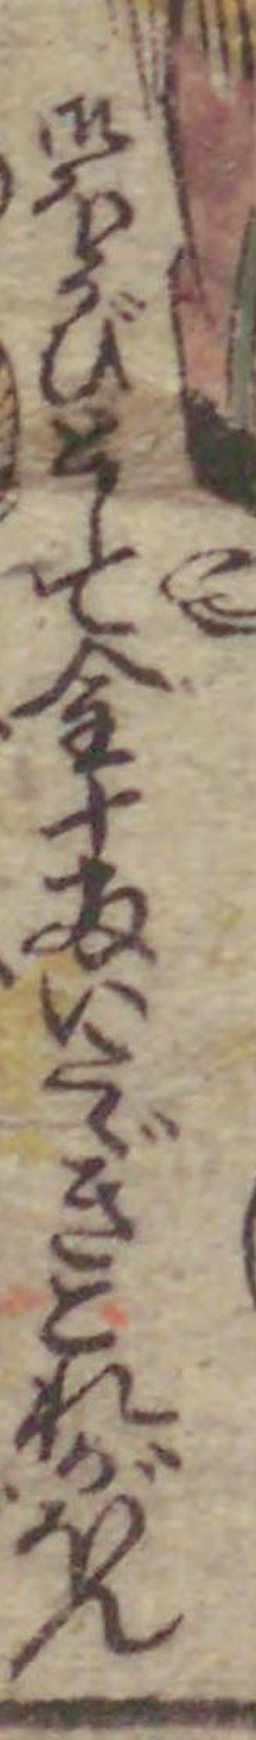御ほうびとして金十両いたゞきこれがほん
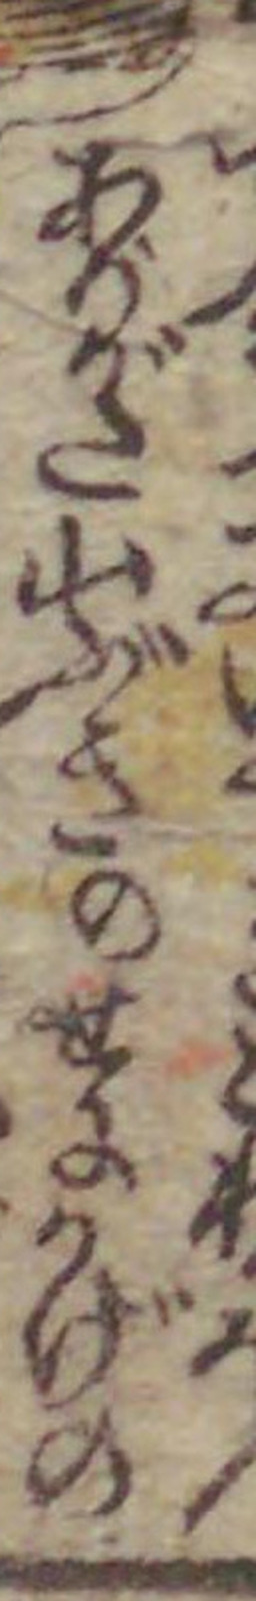のありがた山ぶきのせにかげの
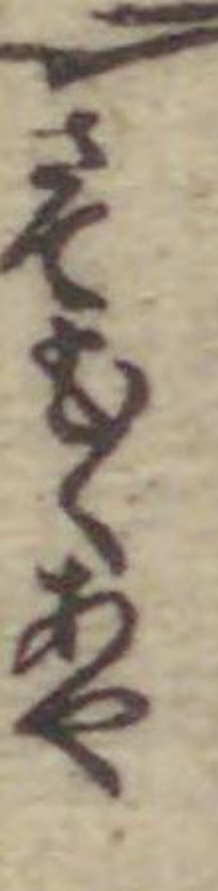さても〳〵あや
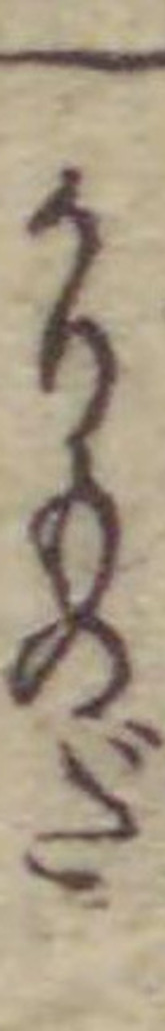かりものだ

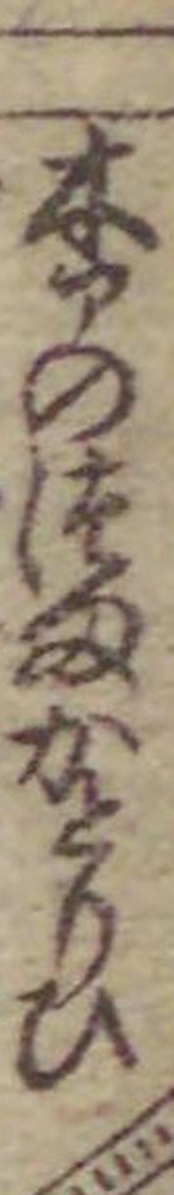木部のつまかとりひ
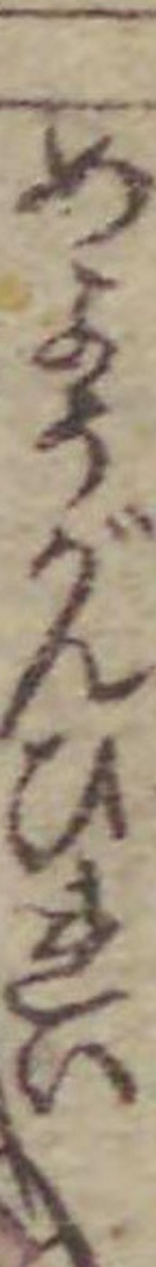めようがんひれい
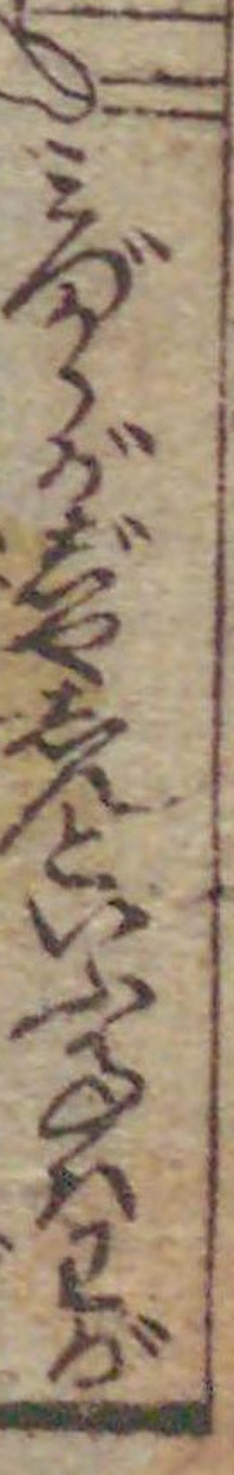みづからがじやしんといふ事はわが
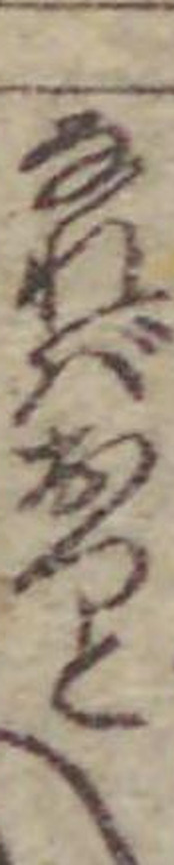なればおつと
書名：娜二代鉢木 5巻
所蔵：国立国会図書館 National Diet Library, JAPAN
